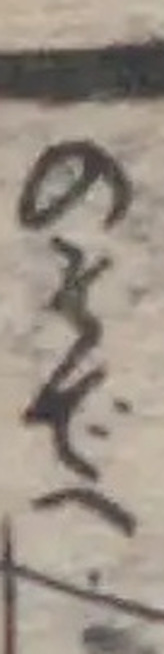のそでへ
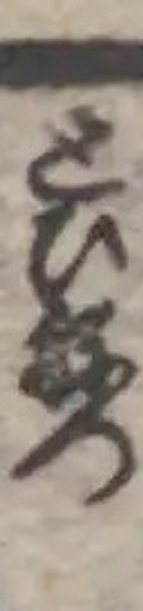とひねつ
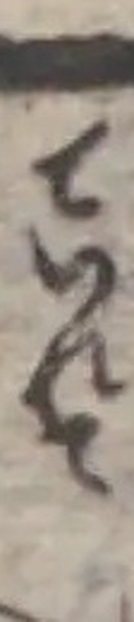ていれて
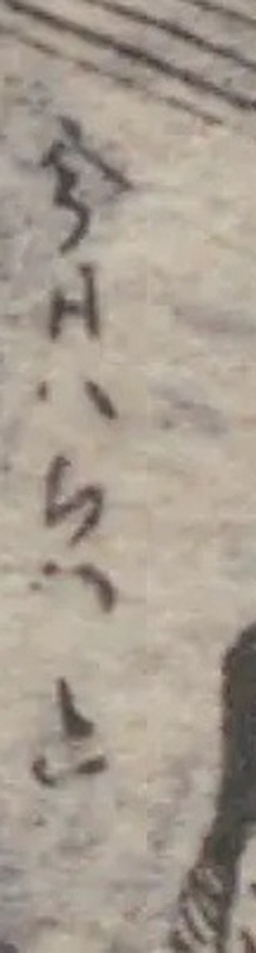今日はちつと
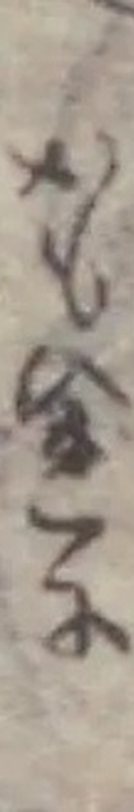かも入れに
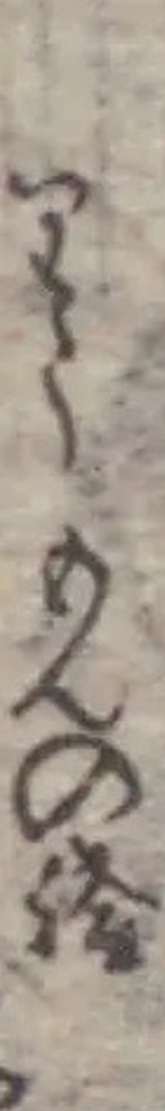りうもんの
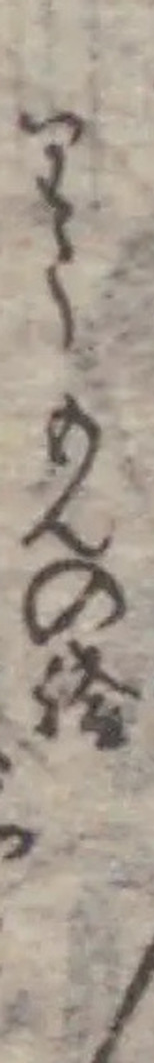りうもんの
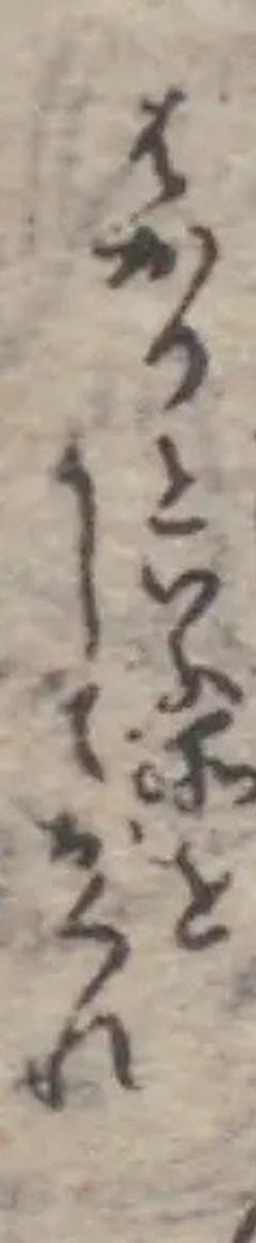かしておくれ
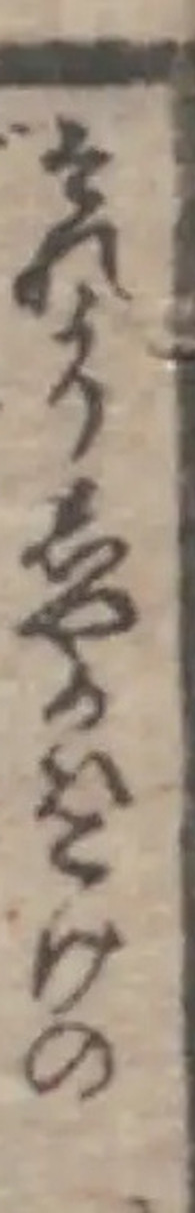それよりしやかはこけの
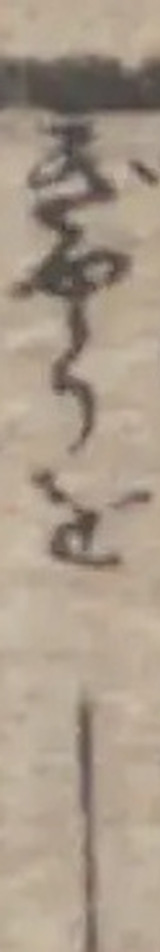ぎやうを
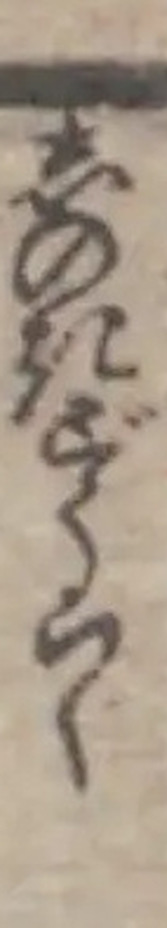しのきどうらう
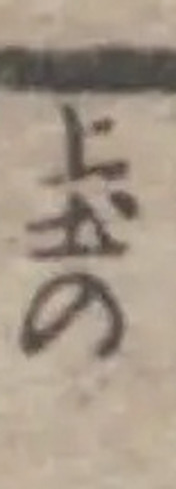上土の
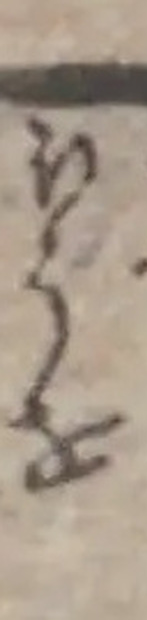ほうを
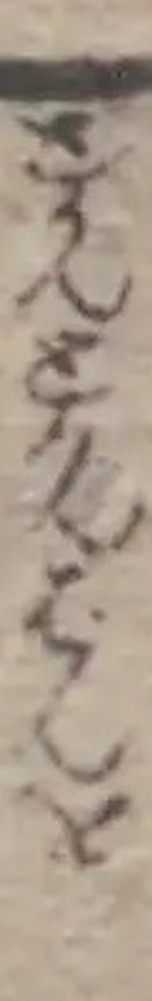とらんとかんばんを
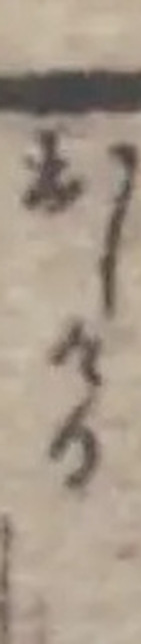出しける
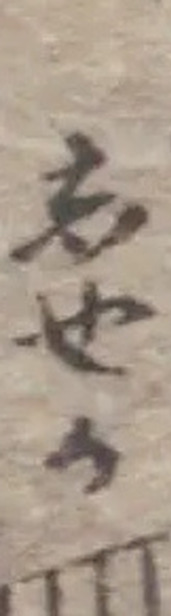しやか
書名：早出来 3巻
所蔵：国立国会図書館 National Diet Library, JAPAN
